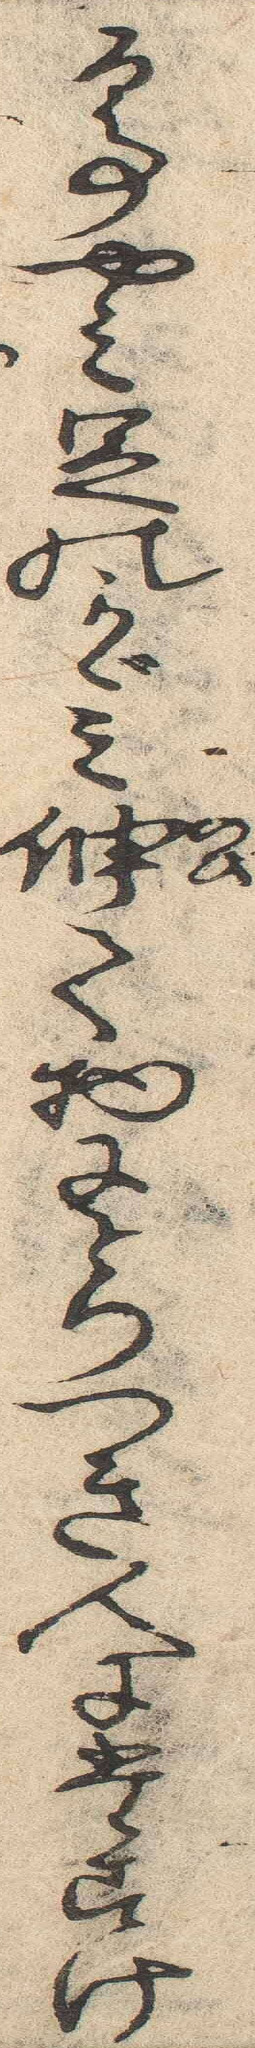る事やみ足のかゞみ伸て物にとりつき人にたすけ
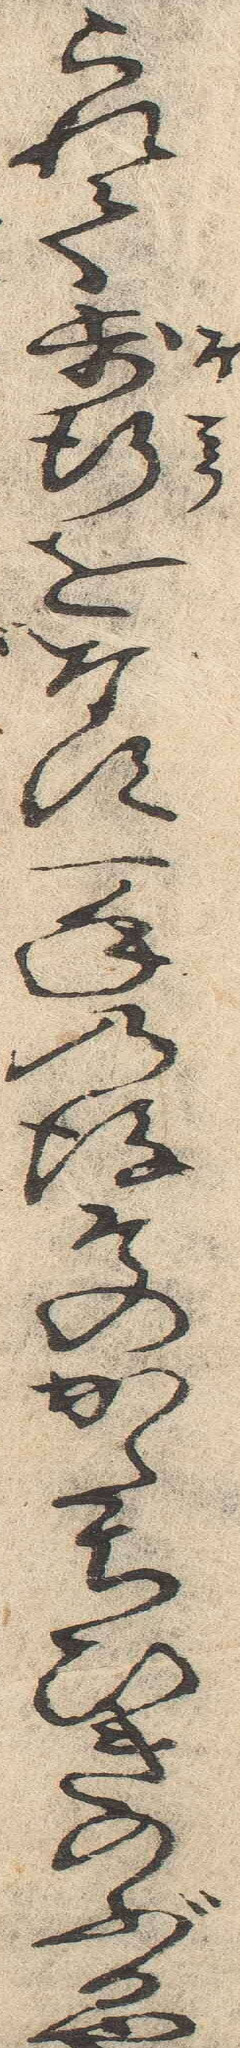られて歩行をなす一年の後そのかたちひきのぶるや
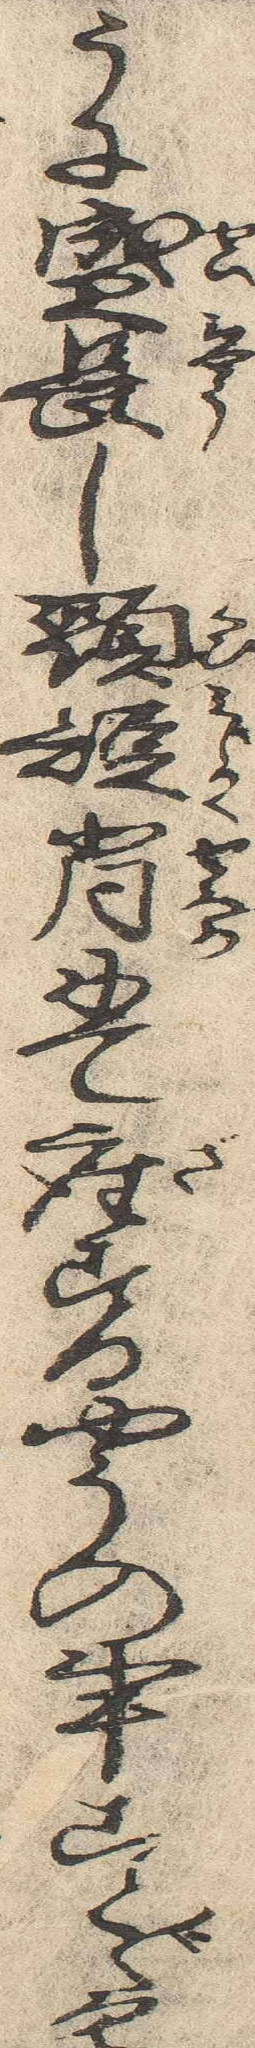うに盛長し頸短背にて座するやうの事こと〴〵く
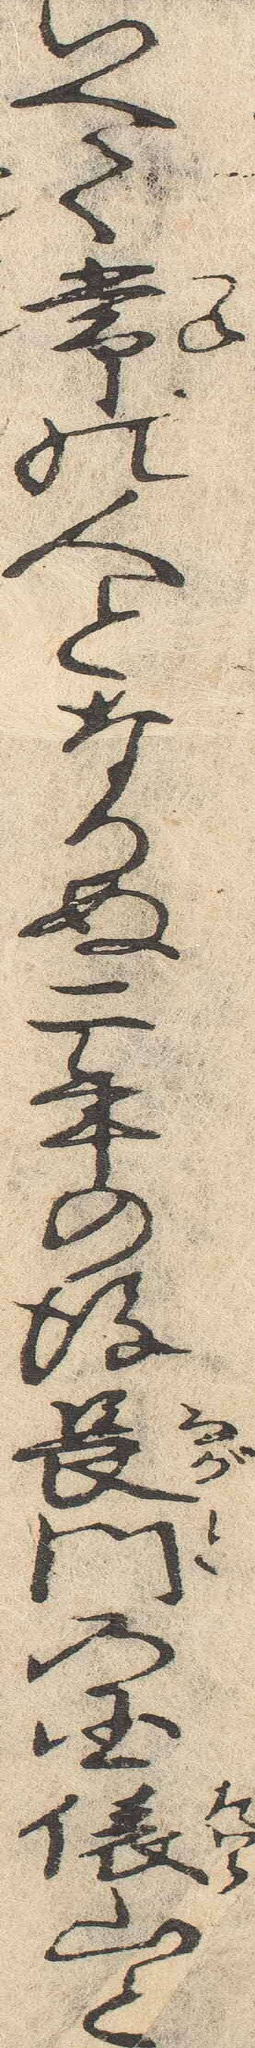いへて常の人となりぬ二年の後長門の国俵山と
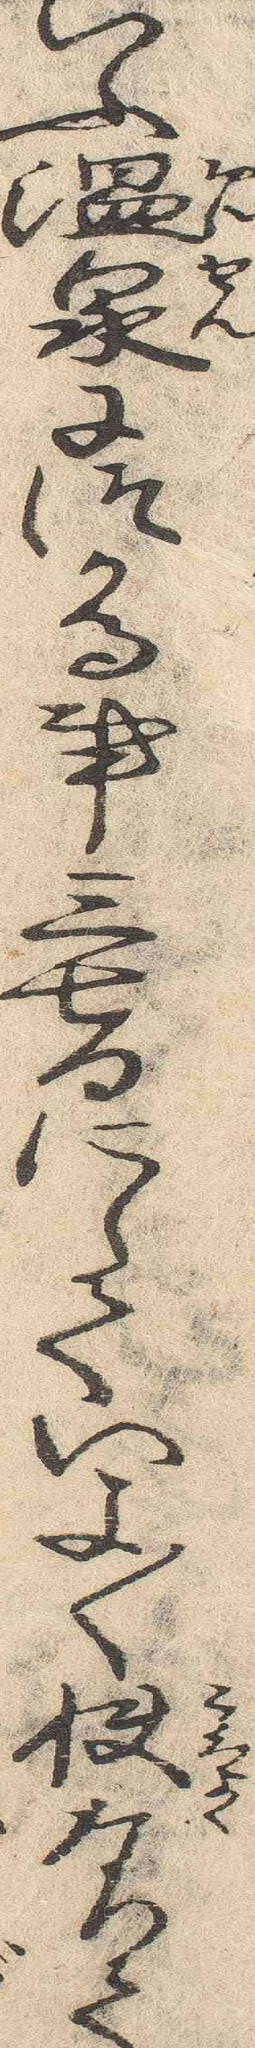いふ温泉につかる三七にしていよ〳〵快なりて
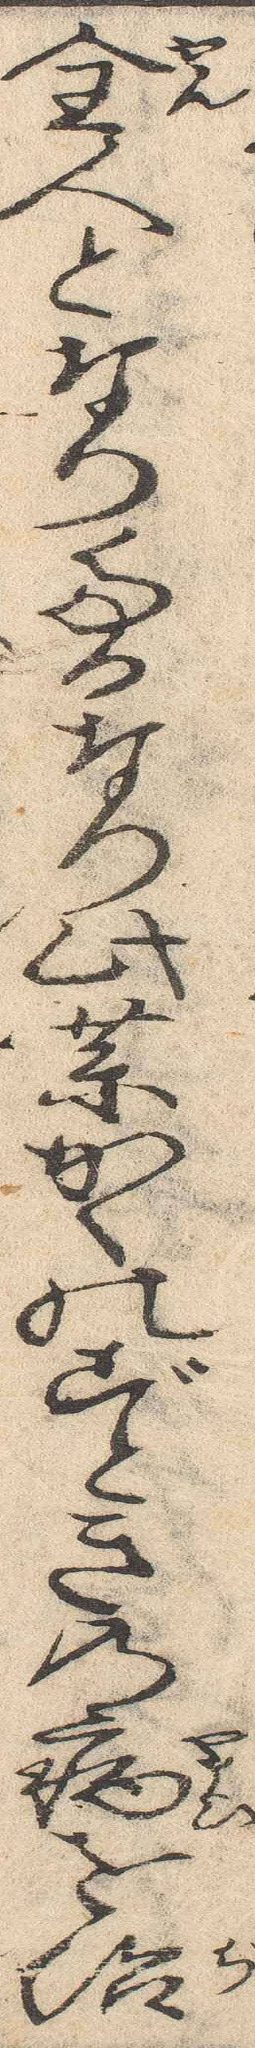全人となりたるなり此薬かくのごときの病を治
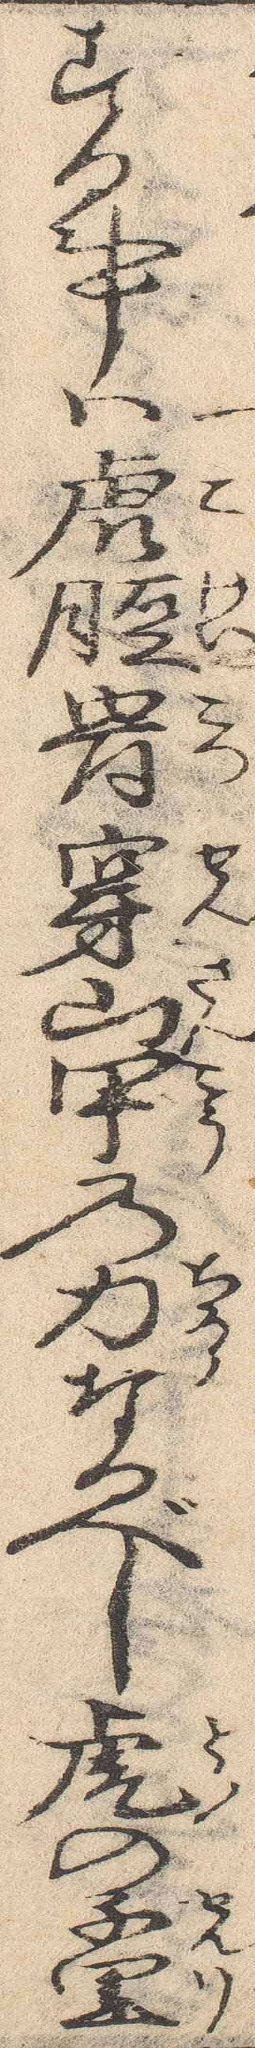する事は虎脛骨穿山甲の力なるべし虎の千里
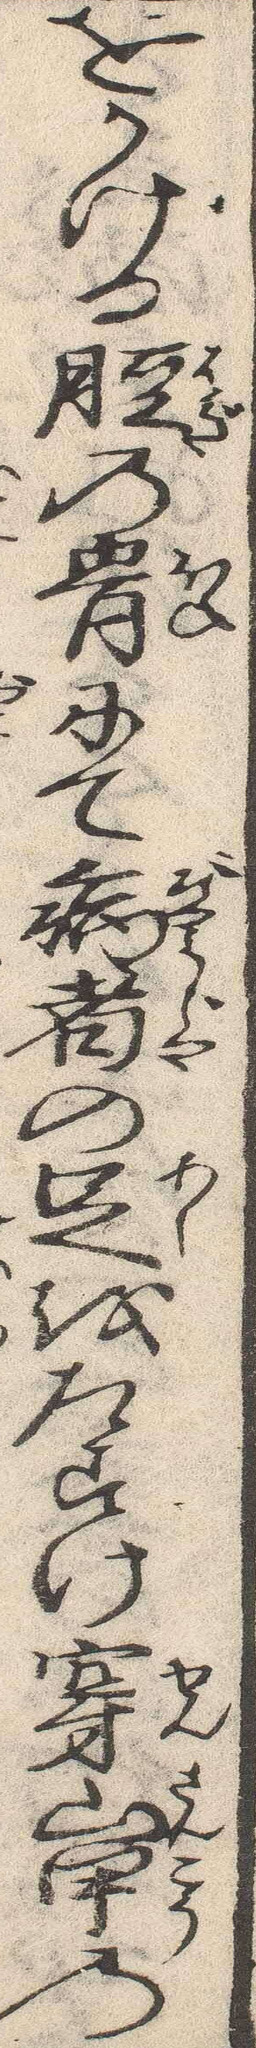をかける脛の骨にて病者の足をたすけ穿山甲の
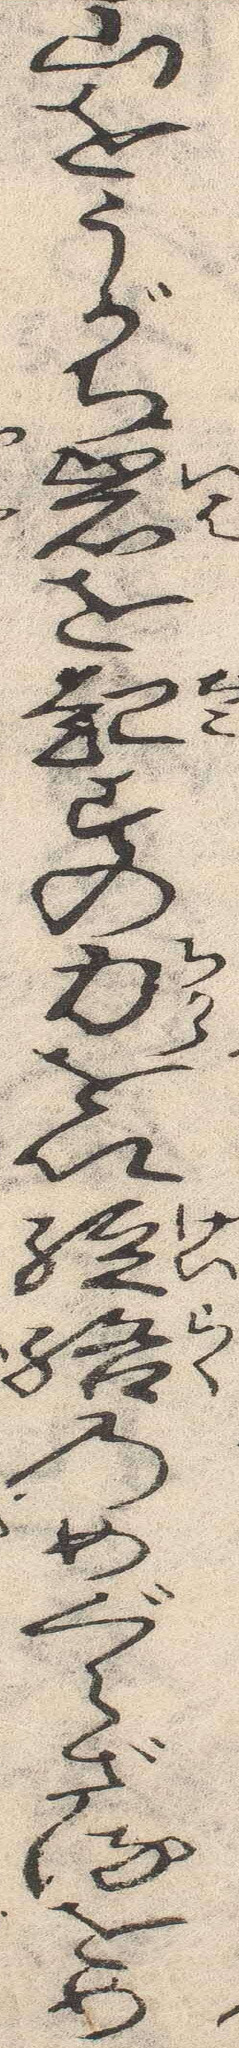山をうがち岩を起すの力を以経絡のめぐらざるをめ
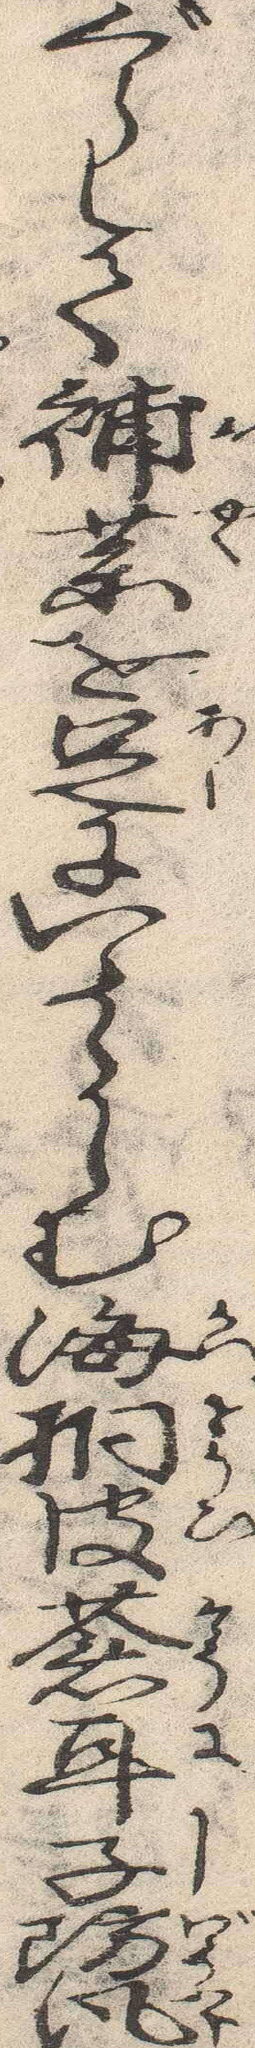ぐらして補薬を足にいたらしむ海桐皮蒼耳子防風
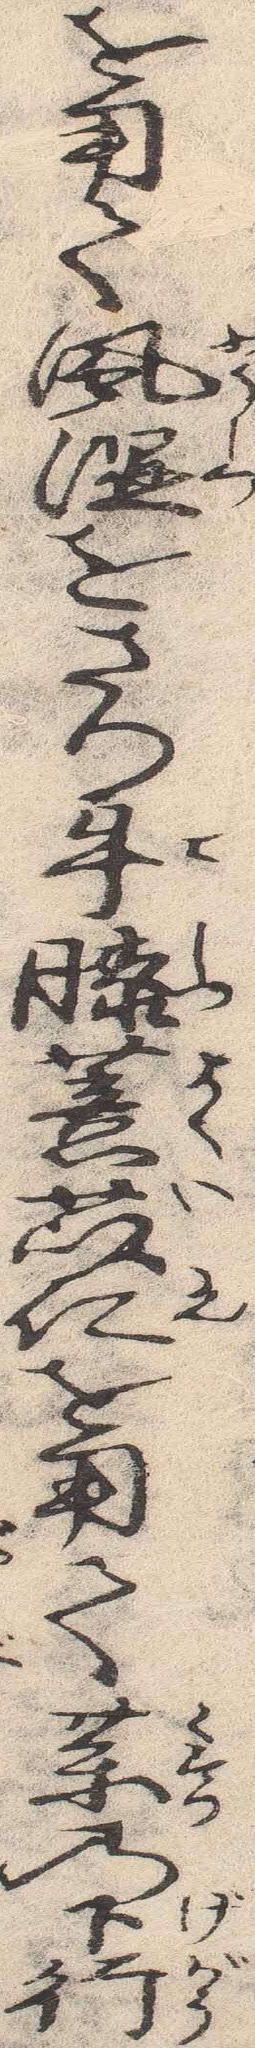を用て風湿をさり牛膝薏苡仁を用て薬の下行
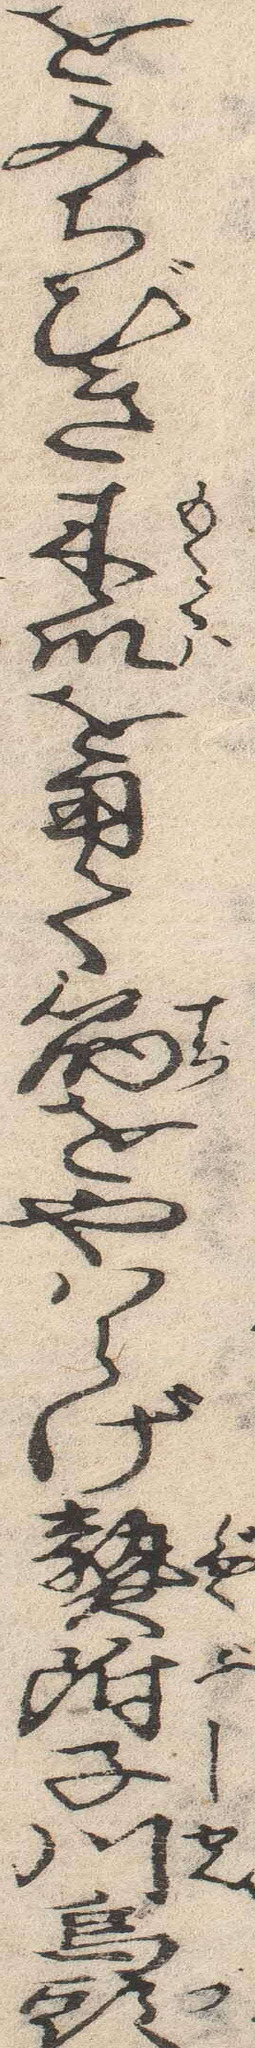をみちびき木瓜を用て筋をやはらげ熟附子川烏頭
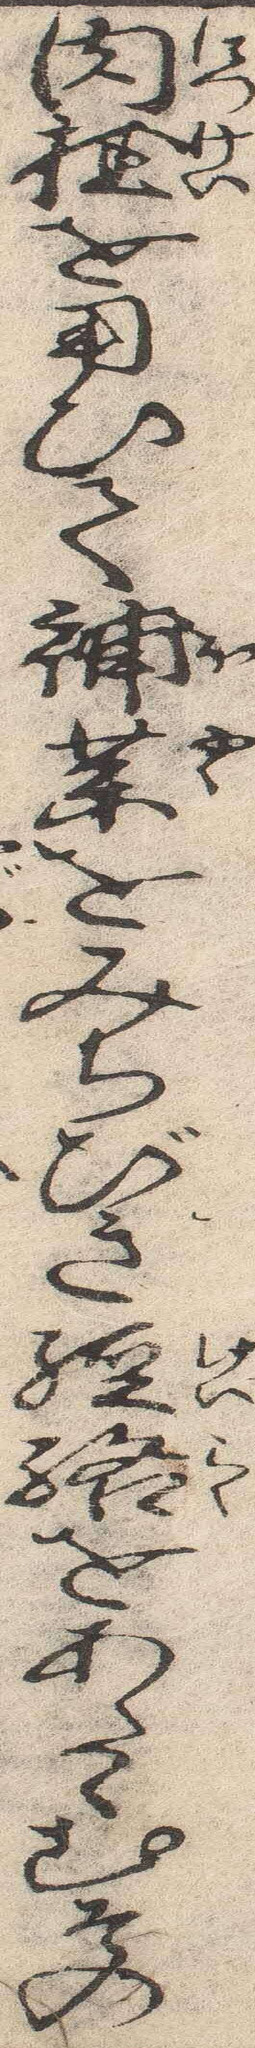肉桂を用ひて補薬をみちびき経絡をあたゝむその
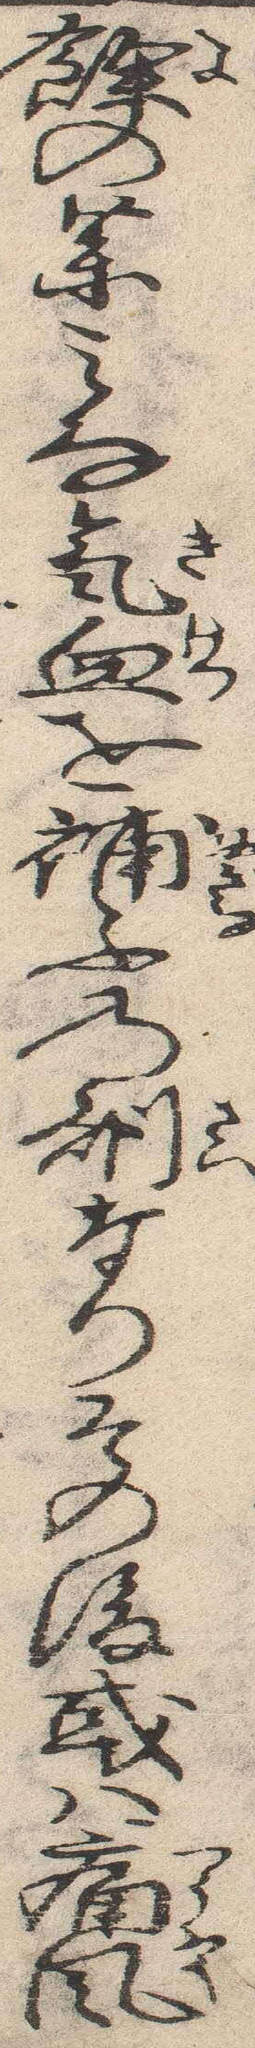余の薬みな気血を補ふの剤なりその後或は痛風
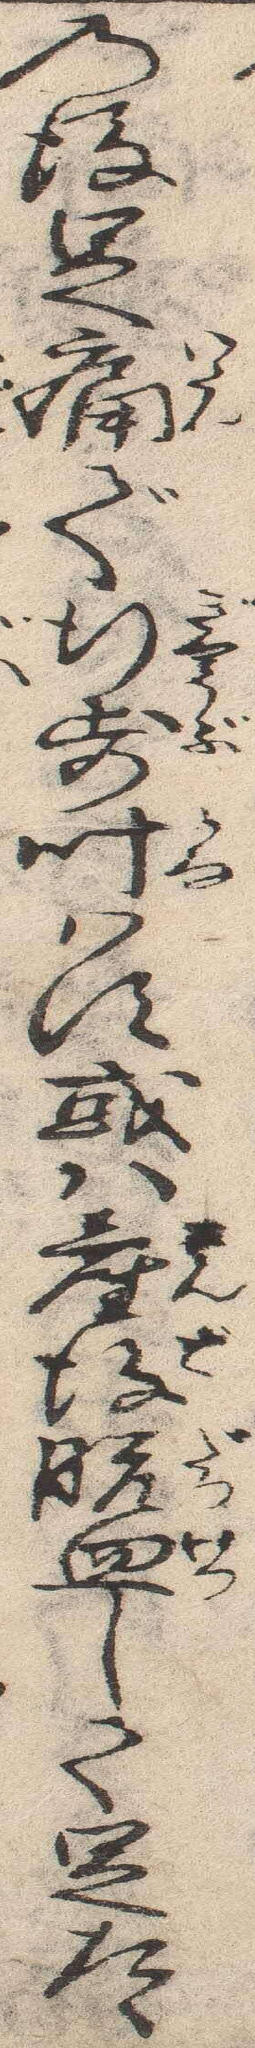の後足痛で行歩叶はす或は産後脱血して足たゝ
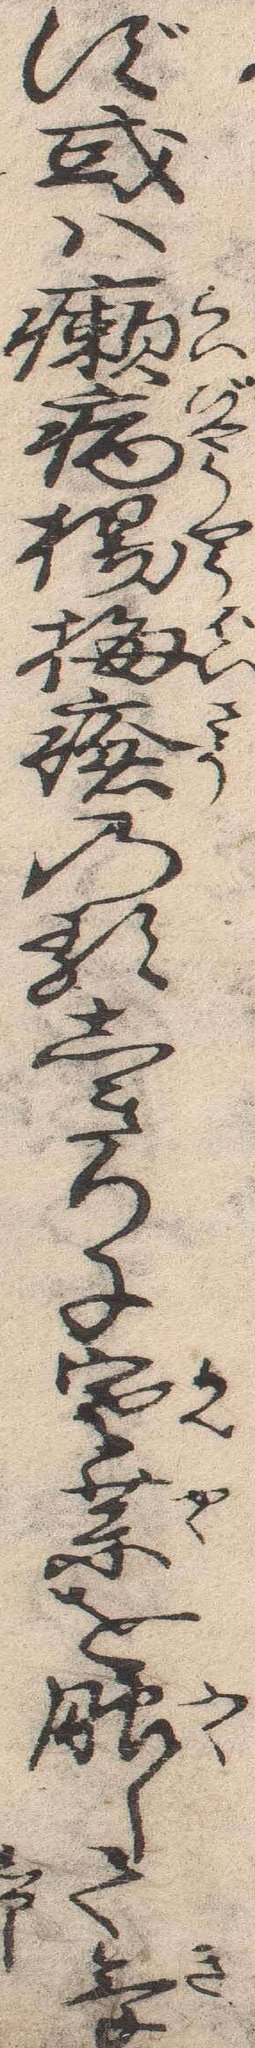ず或は癩病揚梅瘡の類しきりに寒薬を服して気
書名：小児必用養育草
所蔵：東京学芸大学附属図書館 国文学研究資料館
